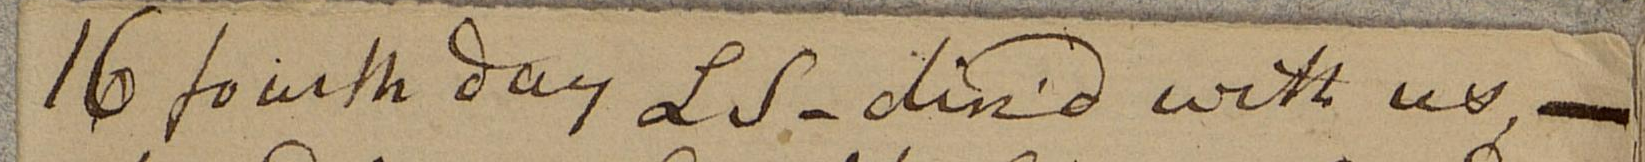16 fourth day LS- din'd with us-
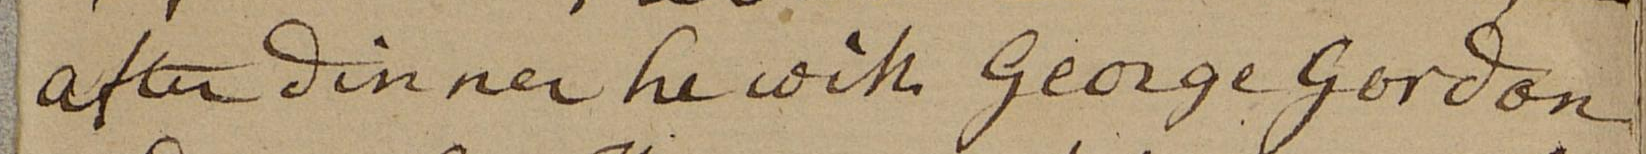after dinner he with George Gordon
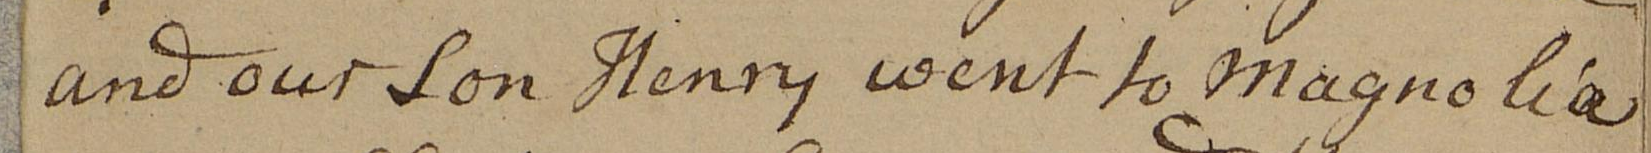and our Son Henry went to Magnolia
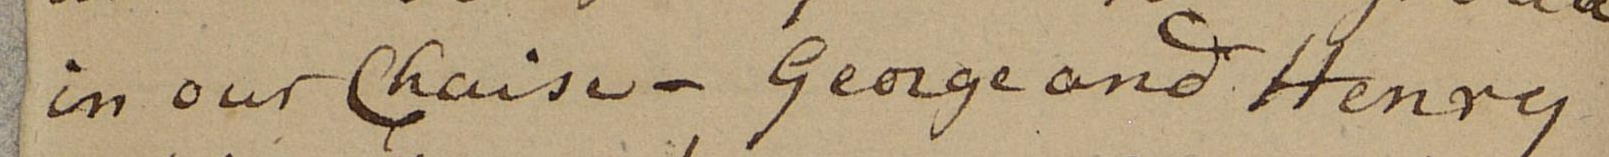in our Chaise- George and Henry
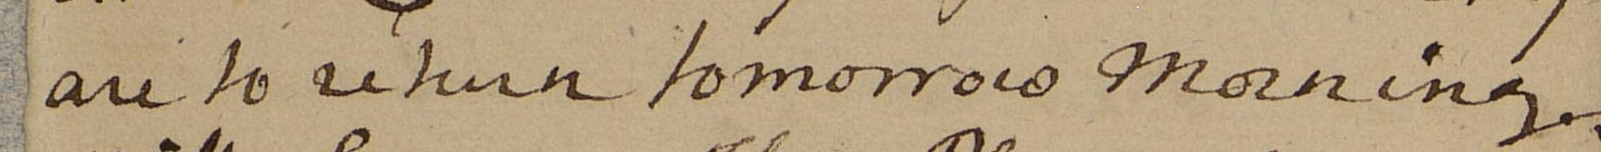are to return tomorrow Morning.
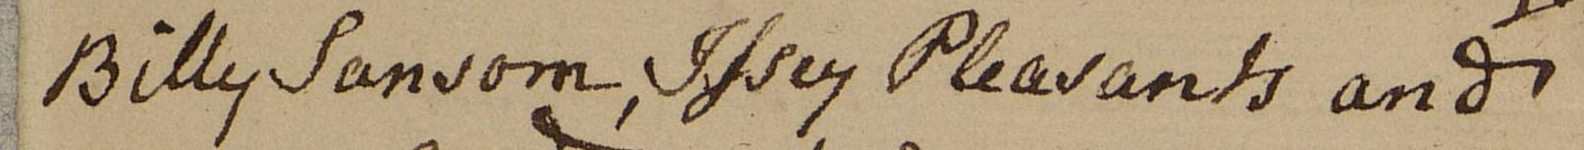Billy Sansom, Issey Pleasants and
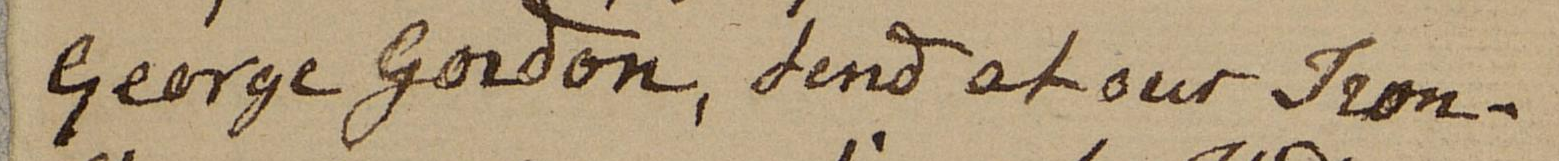George Gordon, tend at our [Tron]-
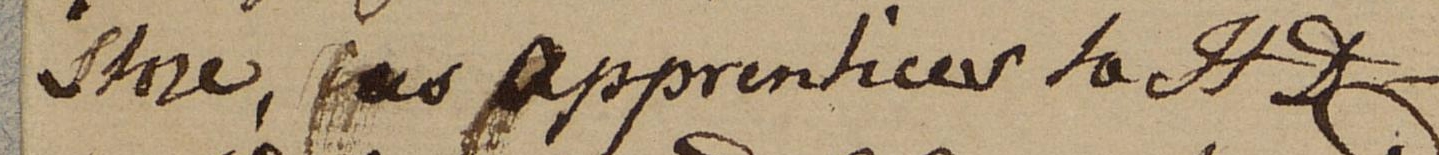Store, as Apprentices to HD-
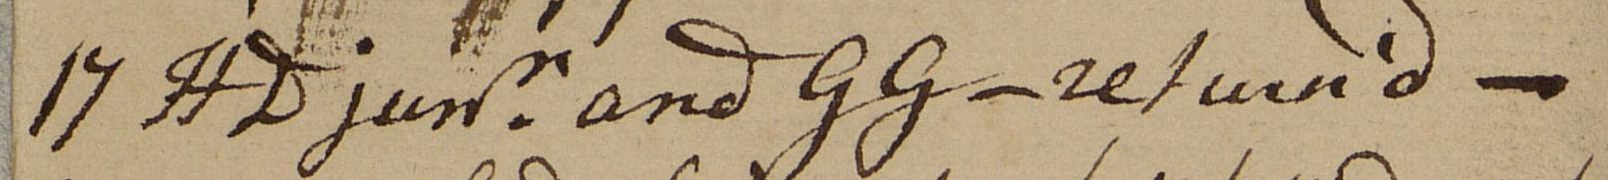17 H D jun^r and GG- return'd-
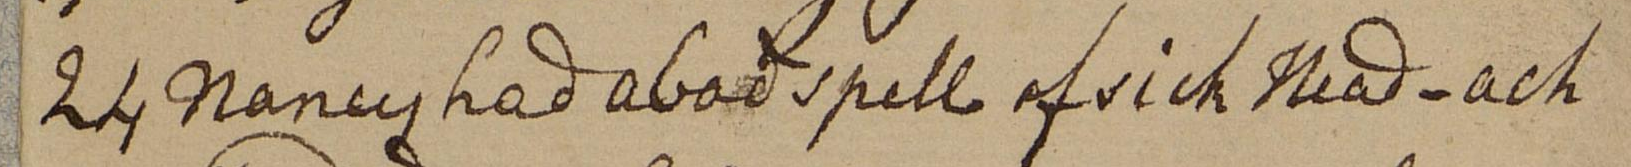24 Nancy had abad spell of sick Head-ach
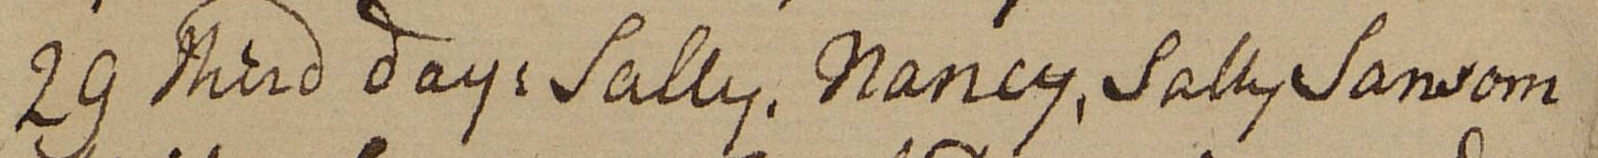29 third day, Sally, Nancy, Sally Sansom
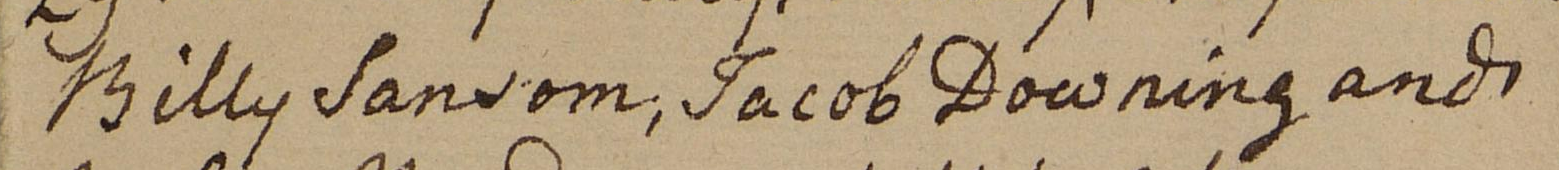Billy Sansom, Jacob Downing and
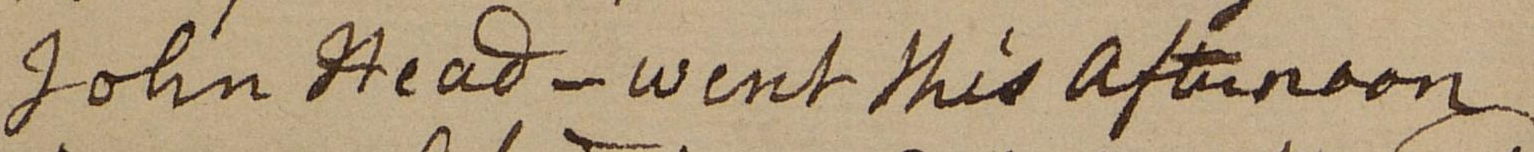John Head- went this Afternoon
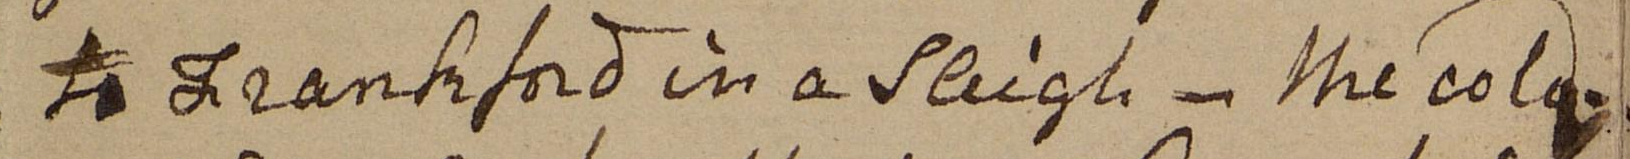to Frankford in a Sleigh- the cold-
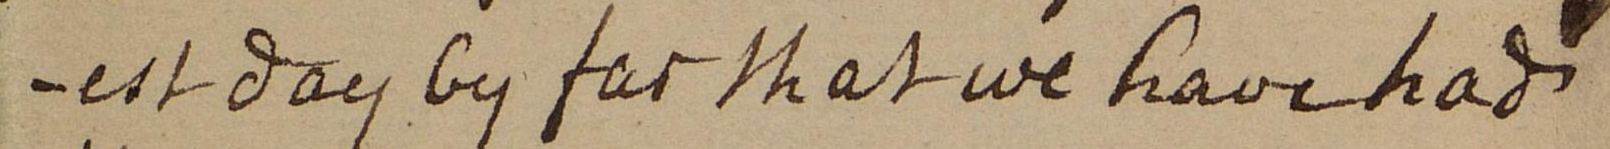-est day by far that we have had
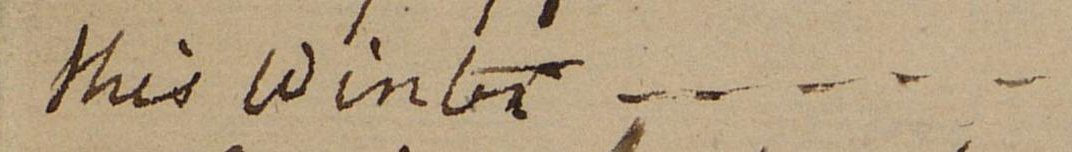this Winter-----
